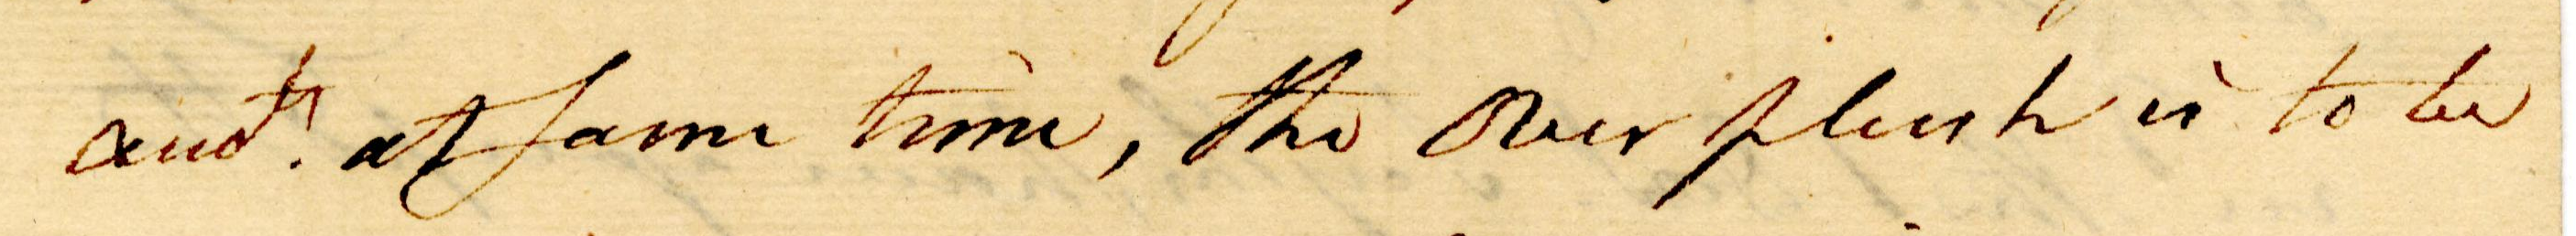acco^ts. at same time, the rear plush is to be
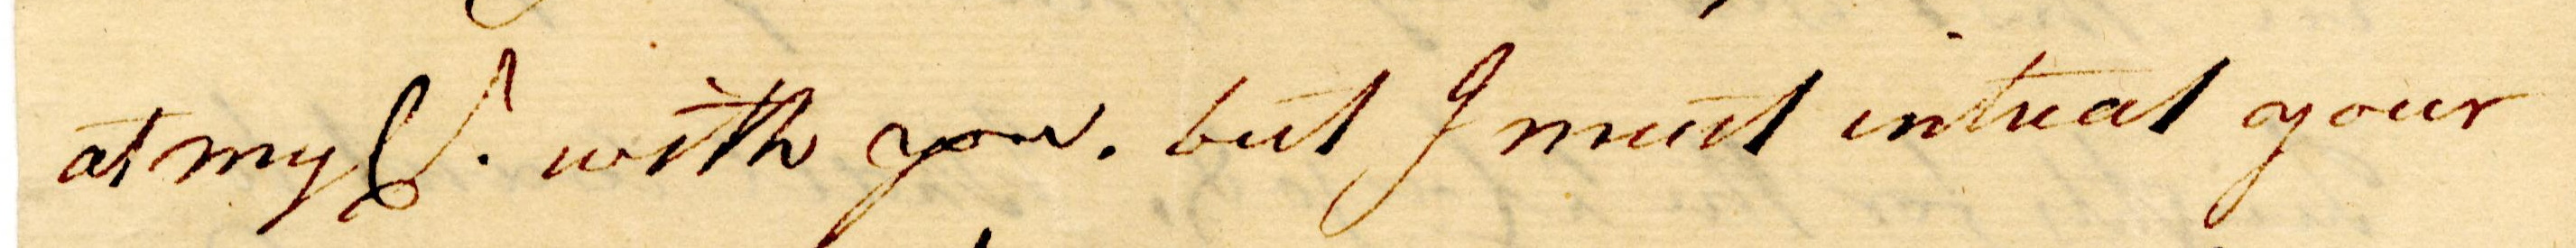at my C^r. with you. but I must intrust your
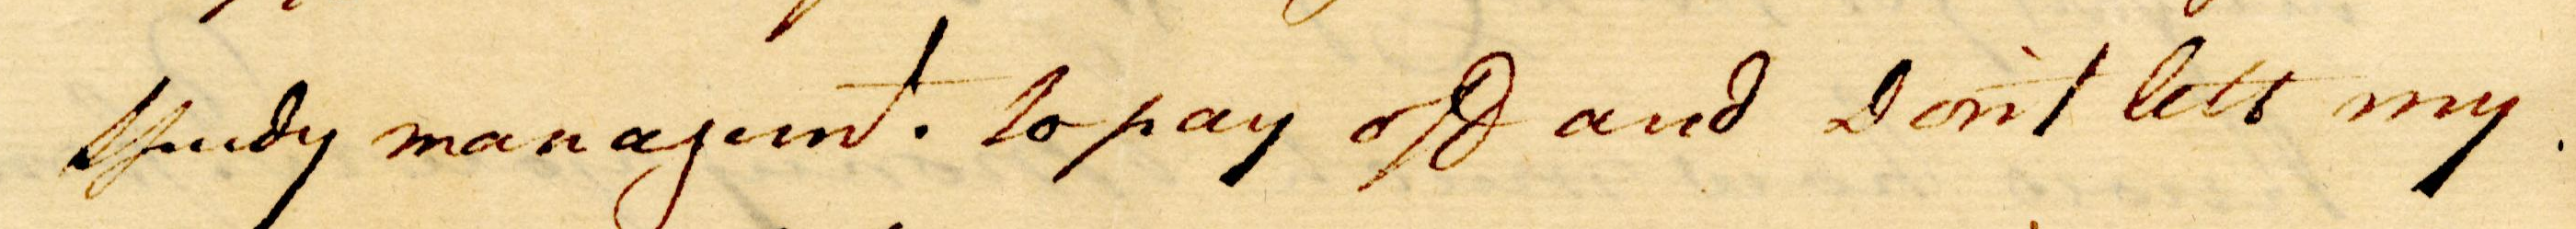speedy managem^t. to pay ofd and Don't lett my
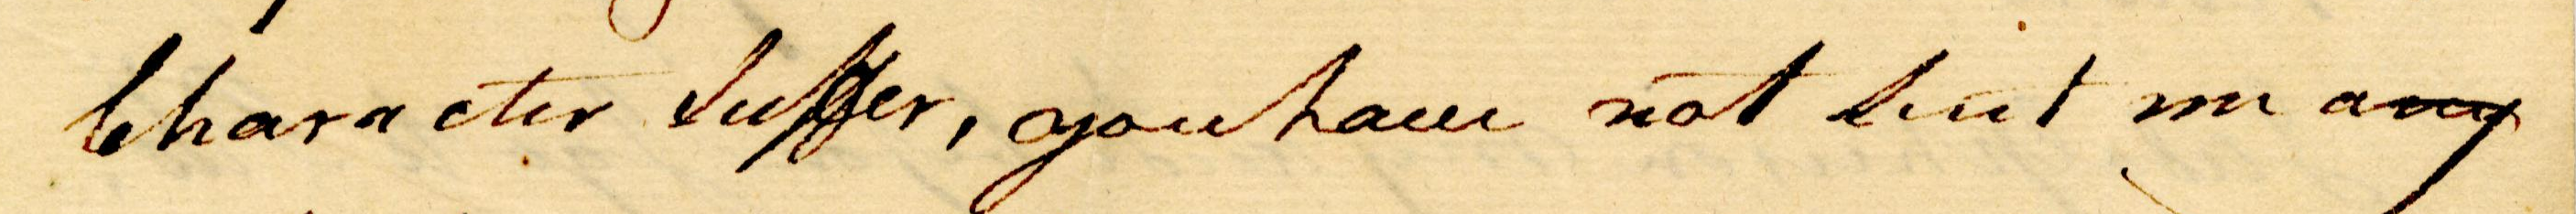Character Suffer, you have not sent me any
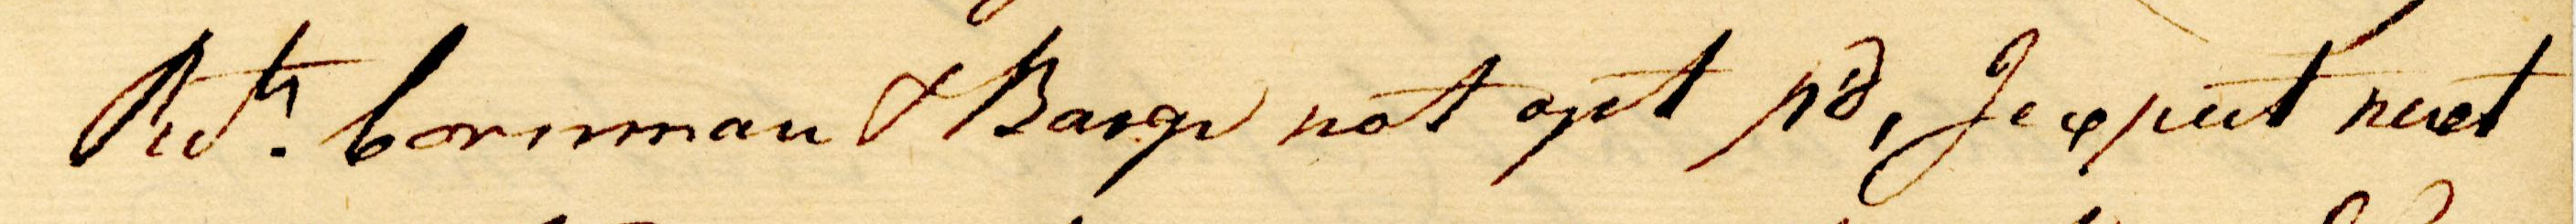Rec^ts. Cormman & Barge not yet p^d, I expect next
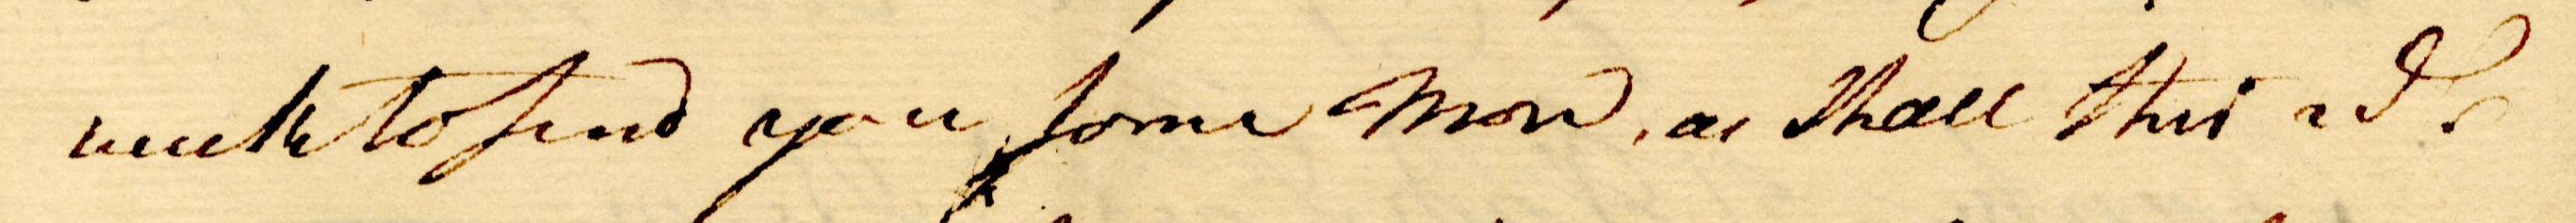week to send you some more, as shall this re^e
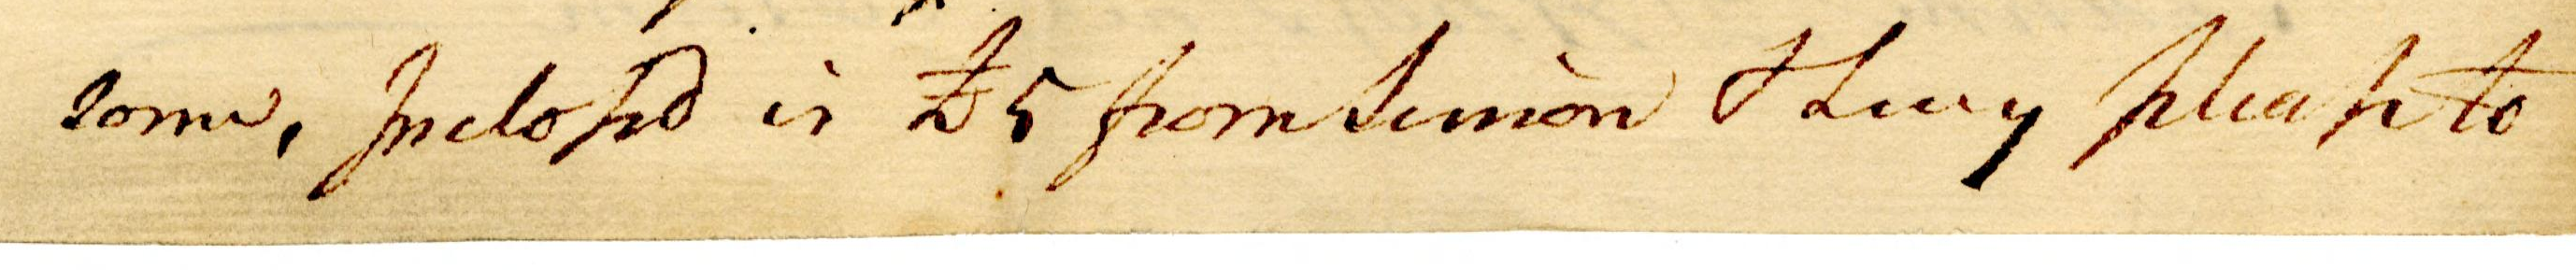some, inclosed is £5 from Simon & Levy please to
